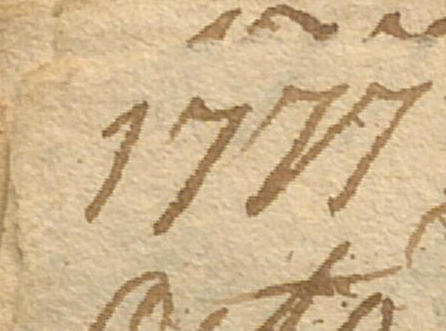1777
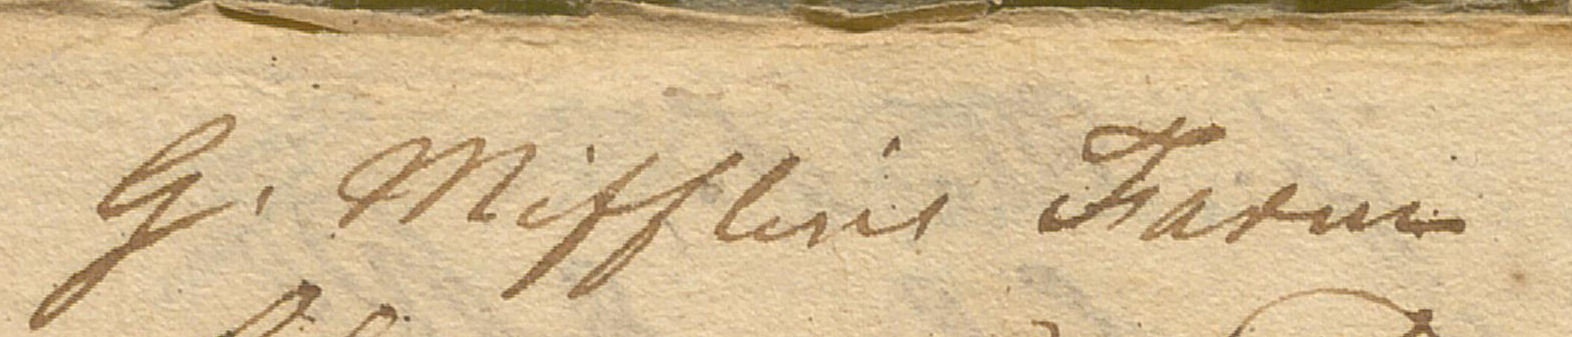G. Mifflins Farm
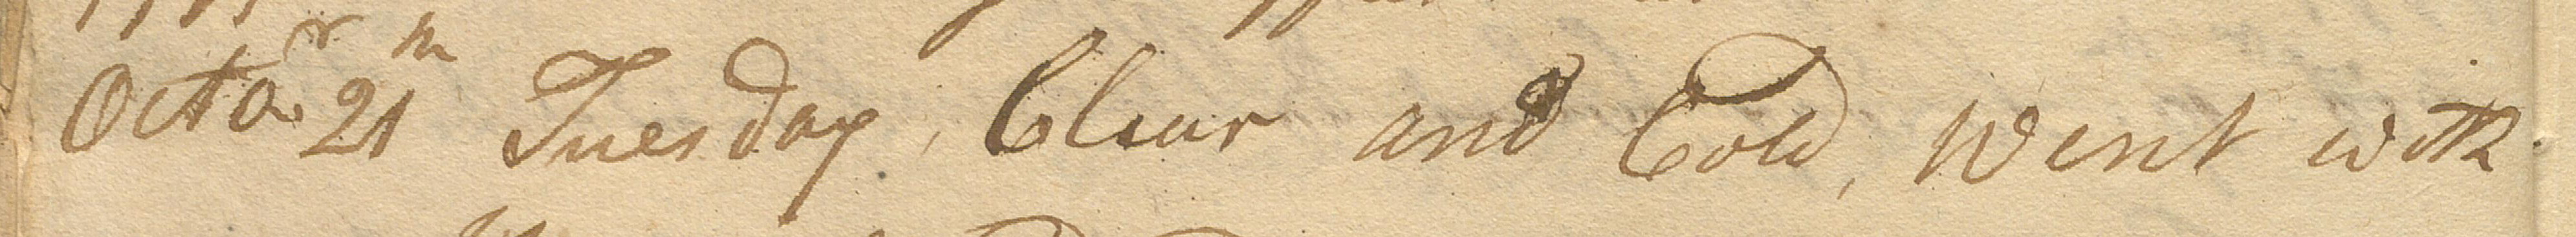Octo^r. 21^th Tuesday, Clear and Cold. went with
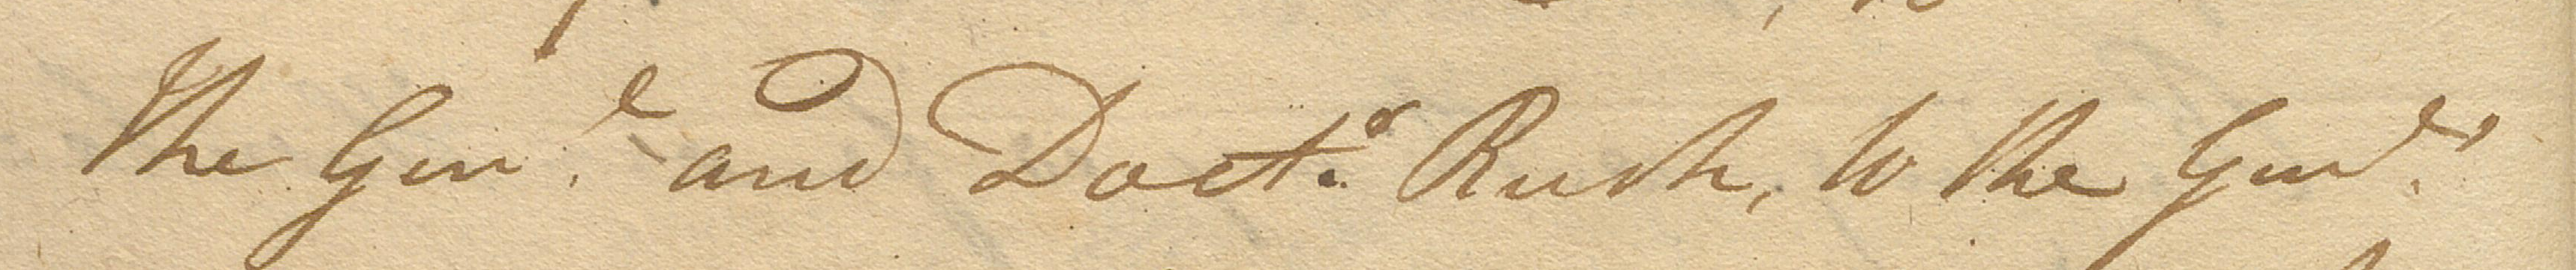The Gen^l. and Doct^r. Rush, to the Gen^ls.
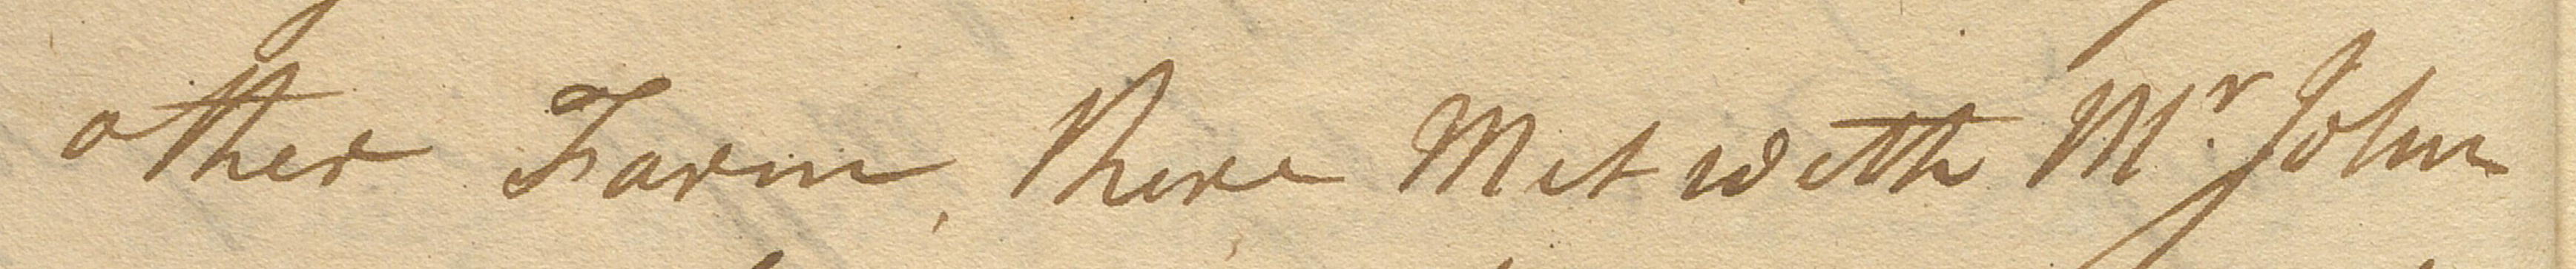other Farm there Met with M^r. John
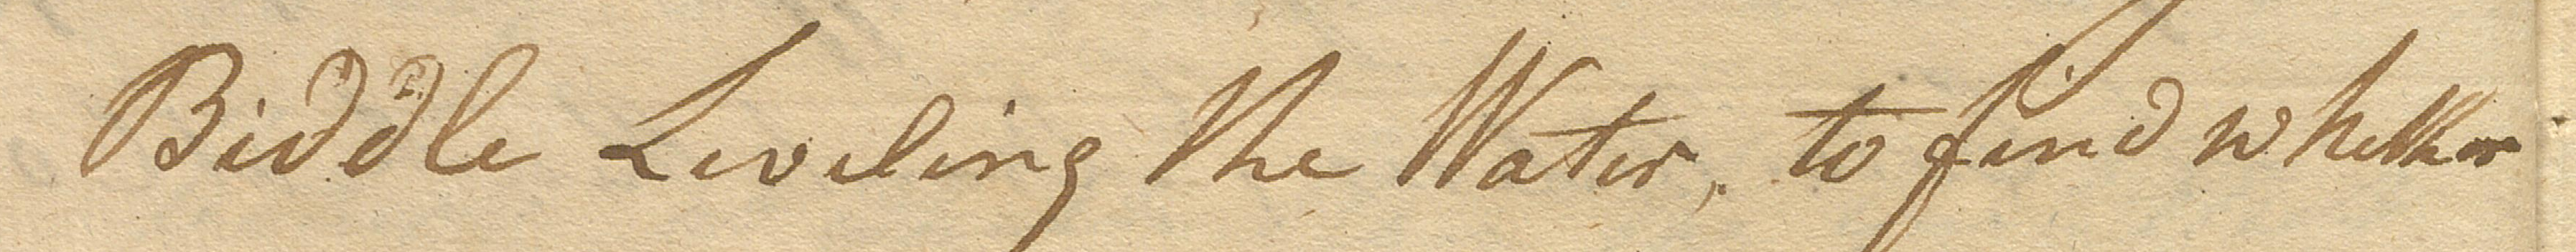Biddle Leveling the Water, to find whether
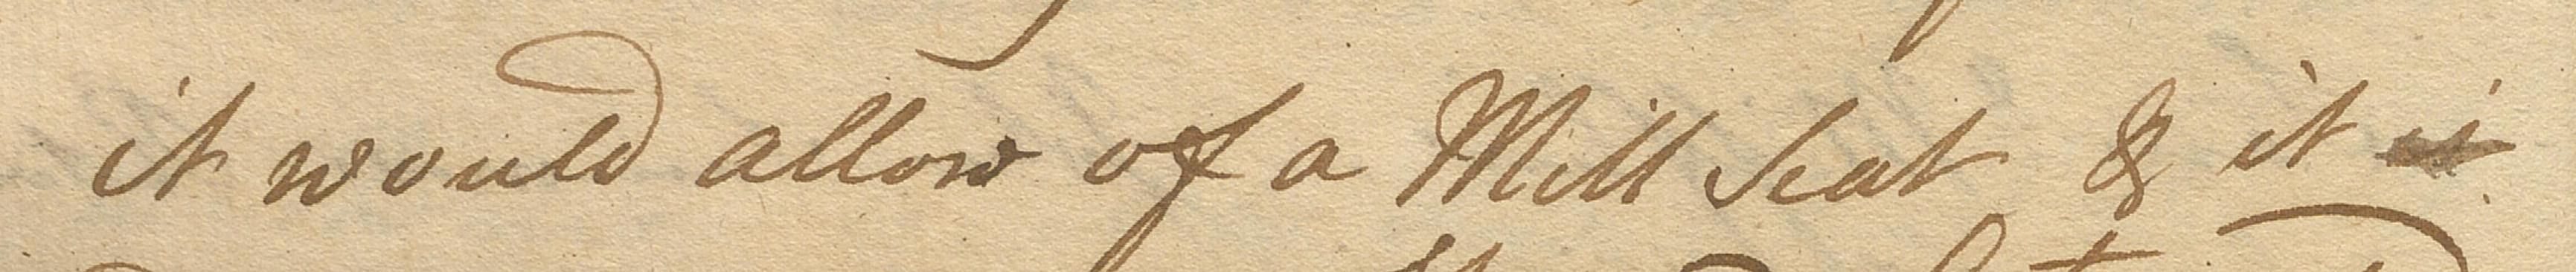it would allow of a Mill Seat & it [is]
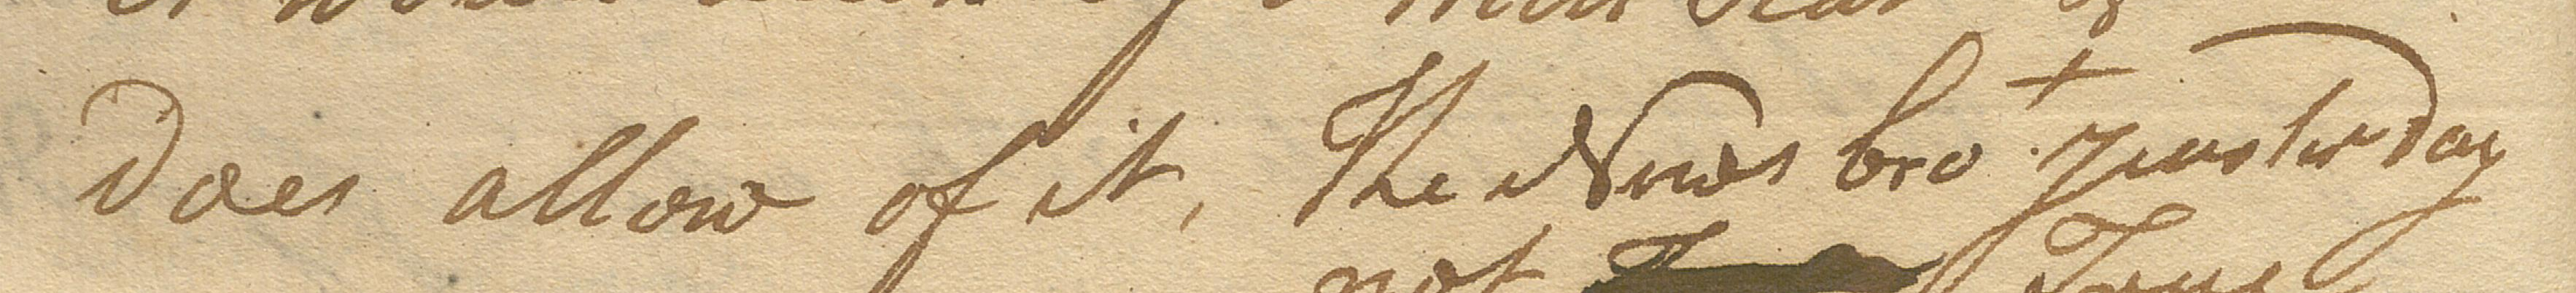does allow of it, The News bro^t yeasterday
